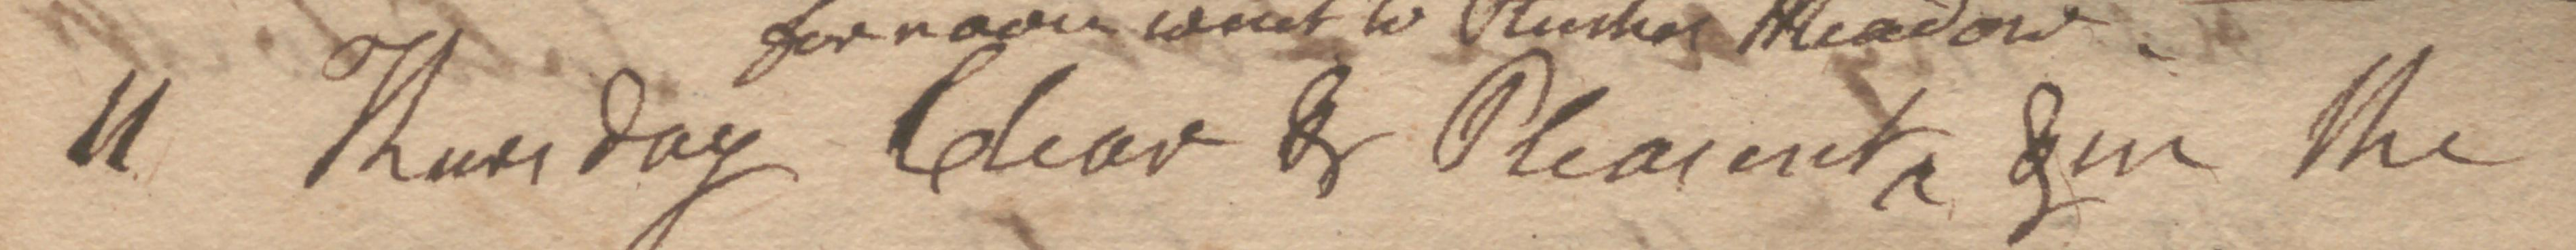1 Thursday Clear & Pleasent, & in the
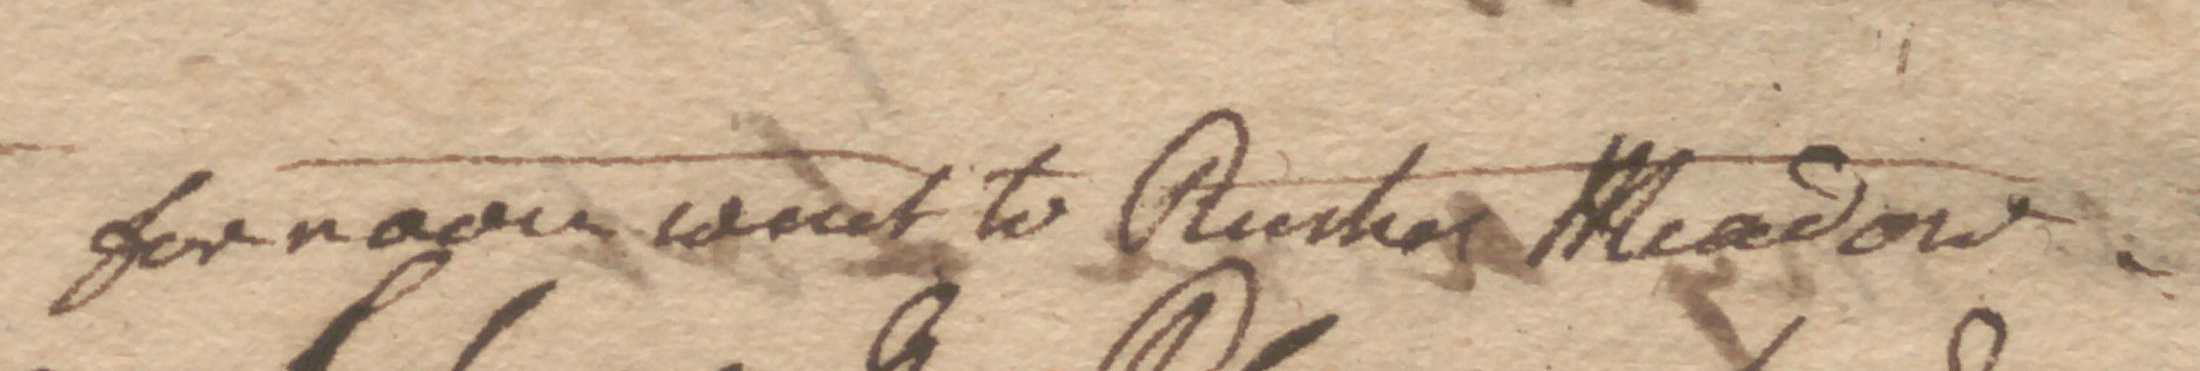fornoon went to Rushes Meadow
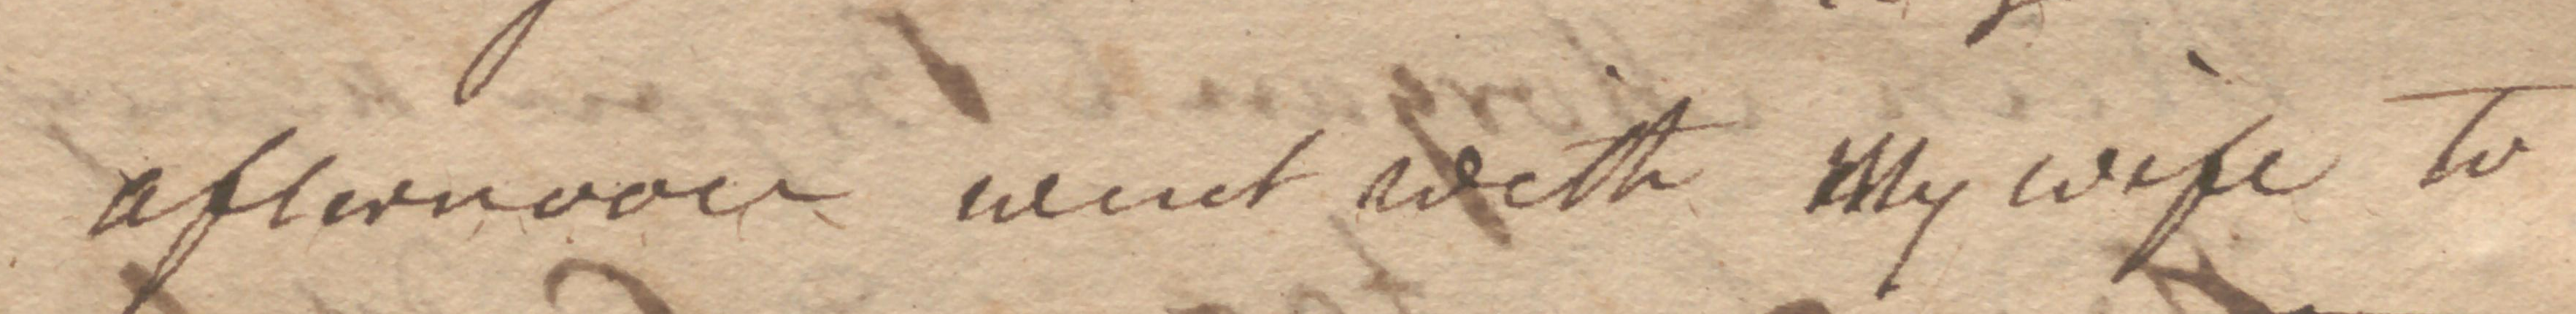afternoon went with My wife to
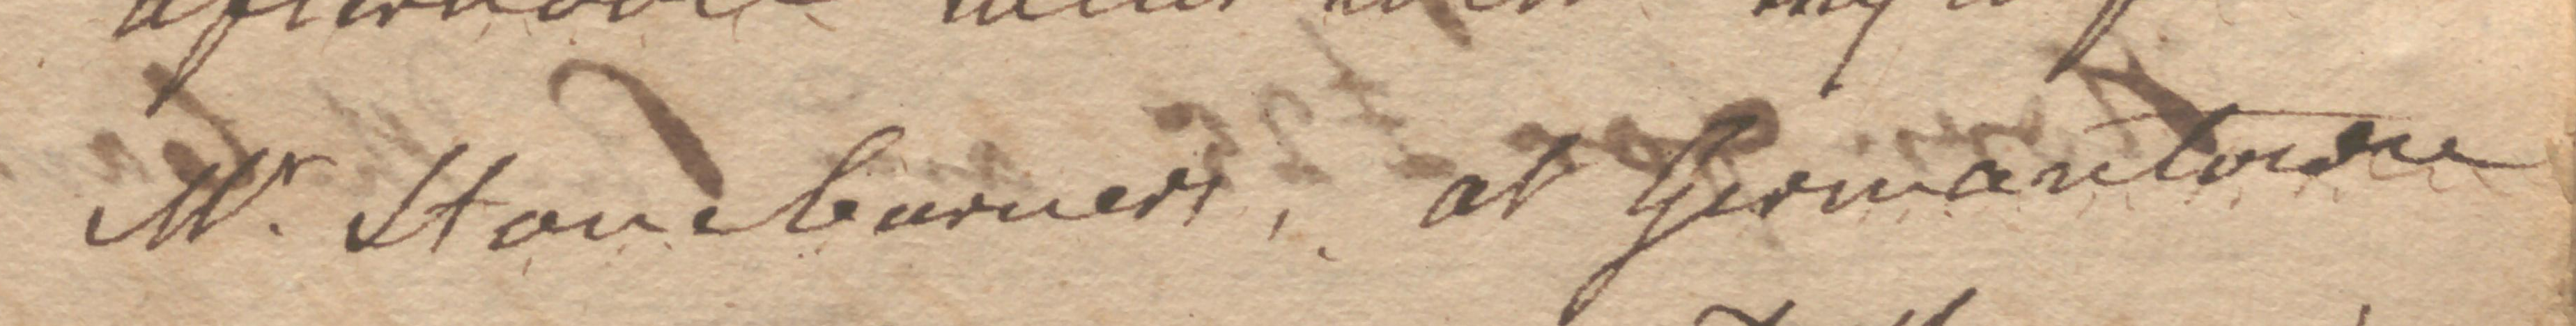M^r. Stoneburners, at Germantown
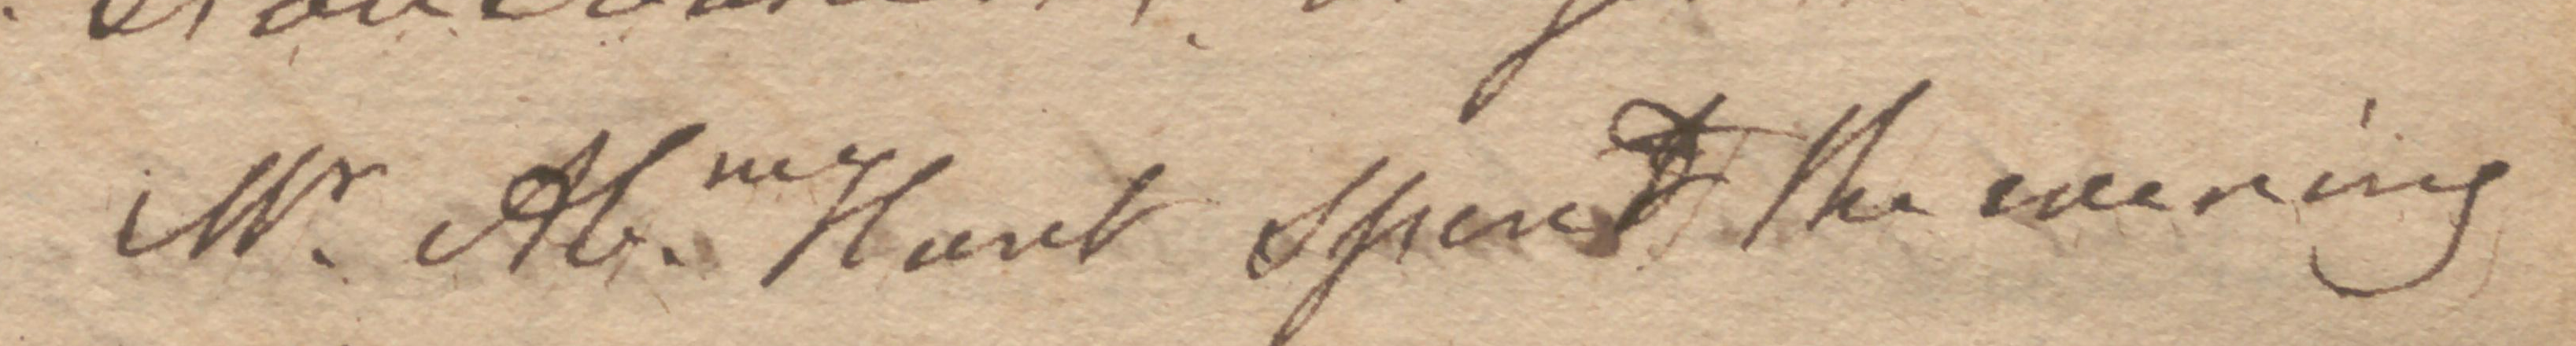M^r. Ab^m. Hunt spent the evening
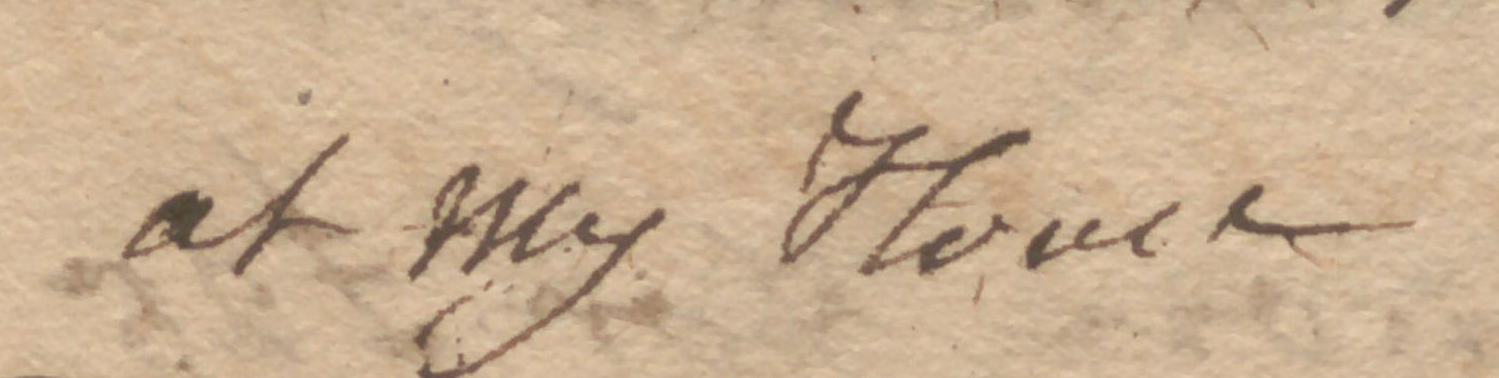at My House
